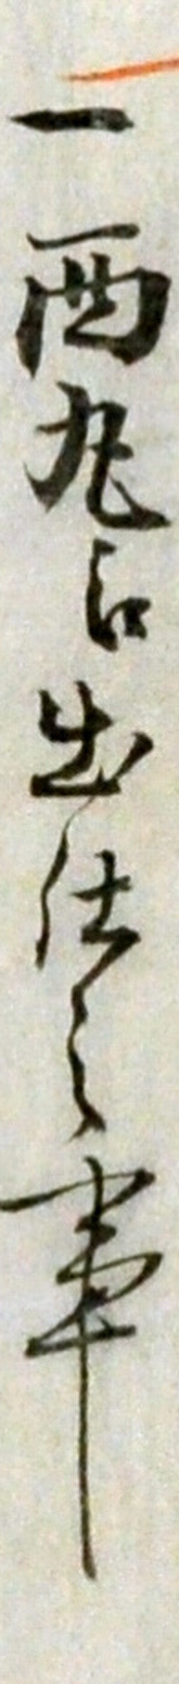一西丸え出仕之事
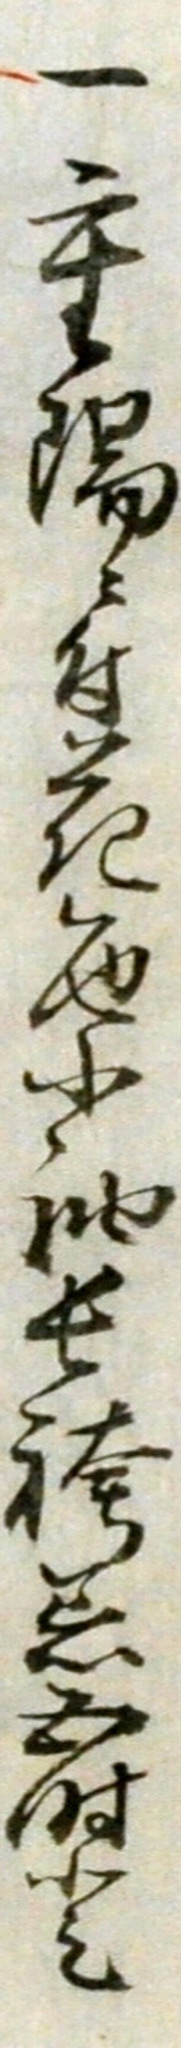一重陽に付花色小袖長袴着五時登
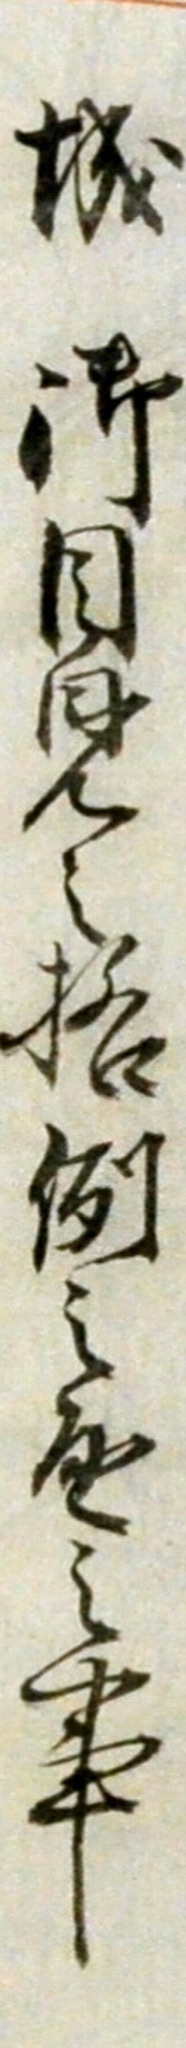城御目見之格例之通之事
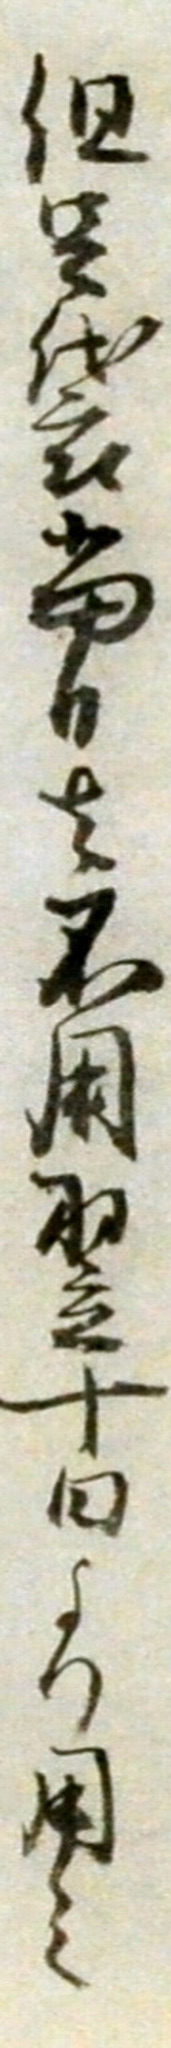但足袋当日は不用翌十日より用之
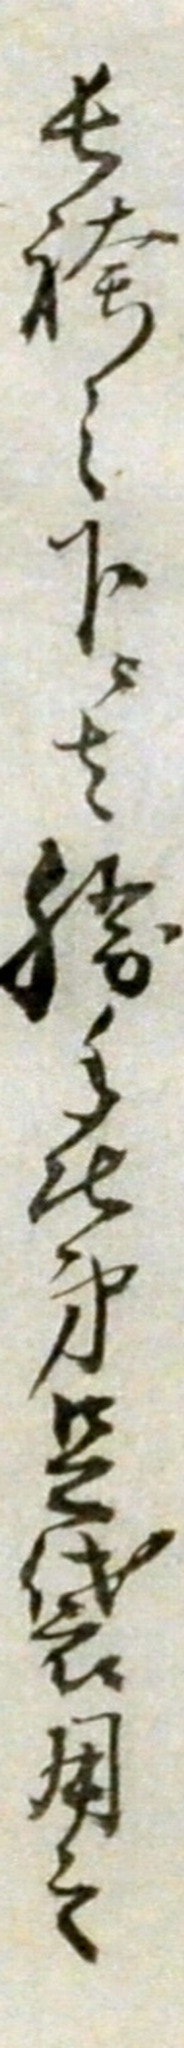長袴之下には勝手次第足袋用之
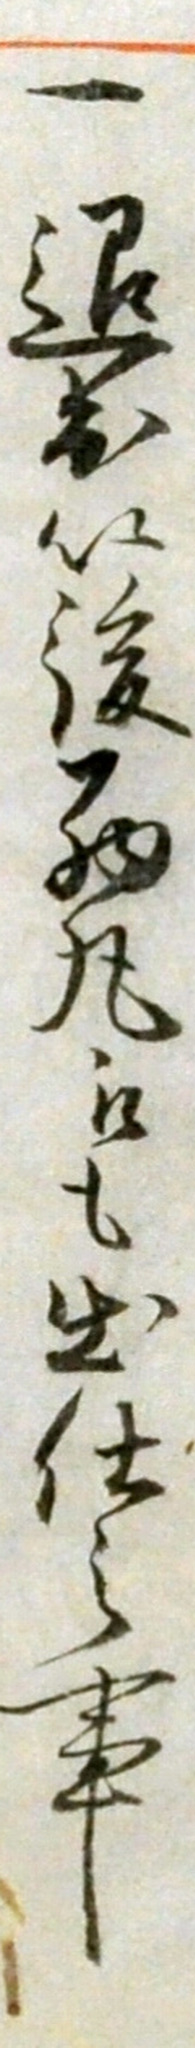一退出以後西丸えも出仕之事
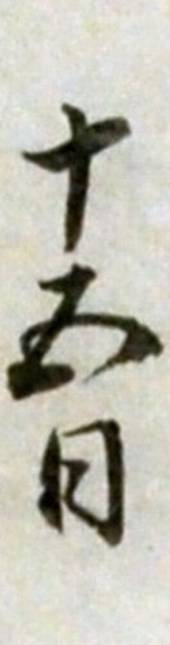十五日
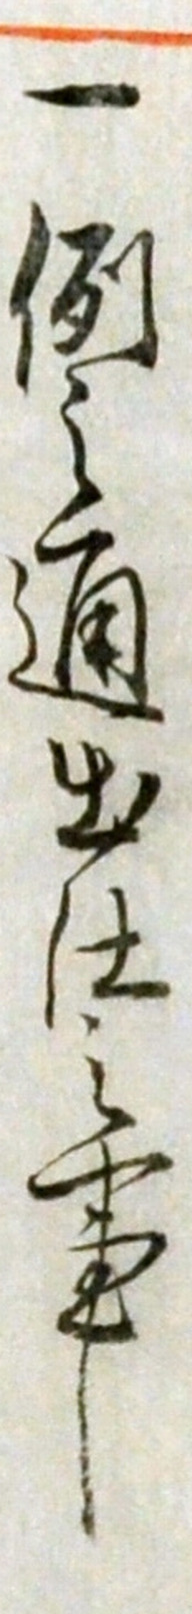一例之通出仕之事

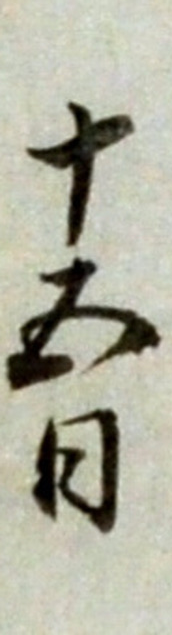十五日
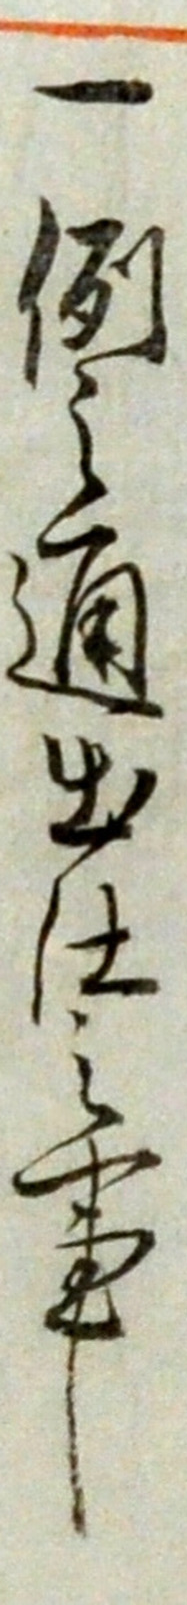一例之通出仕之事
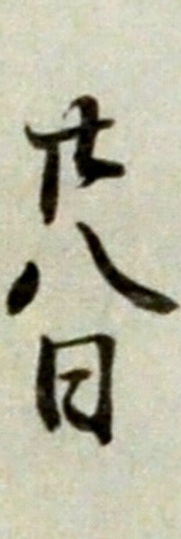廿八日
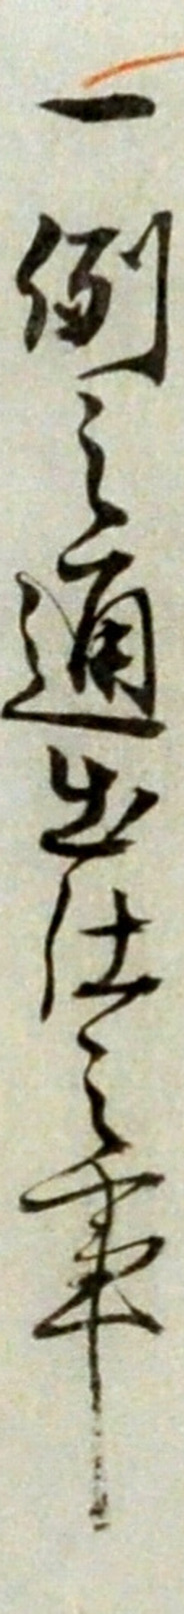一例之通出仕之事
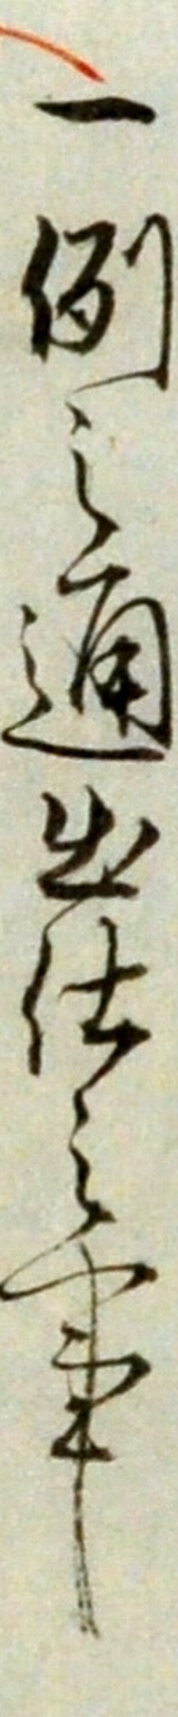一例之通出仕之事
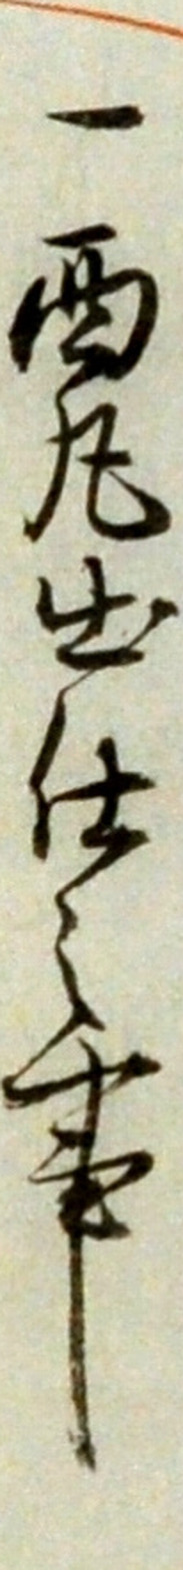一西丸出仕之事
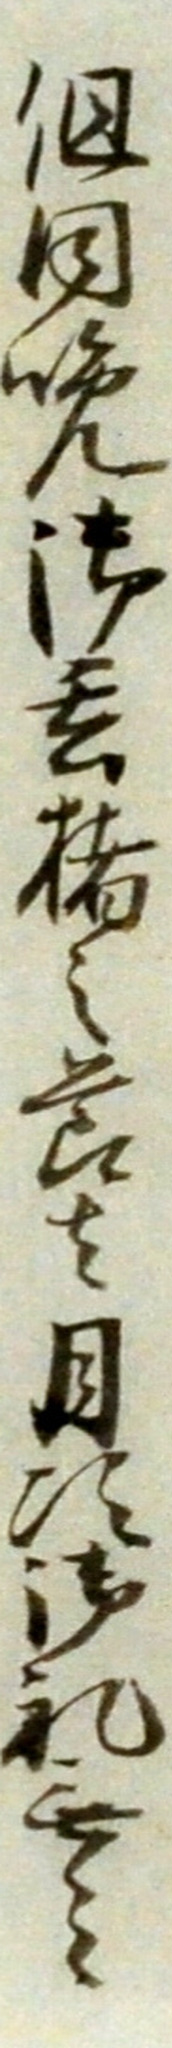但同晩御玄猪之節は月次御礼無之
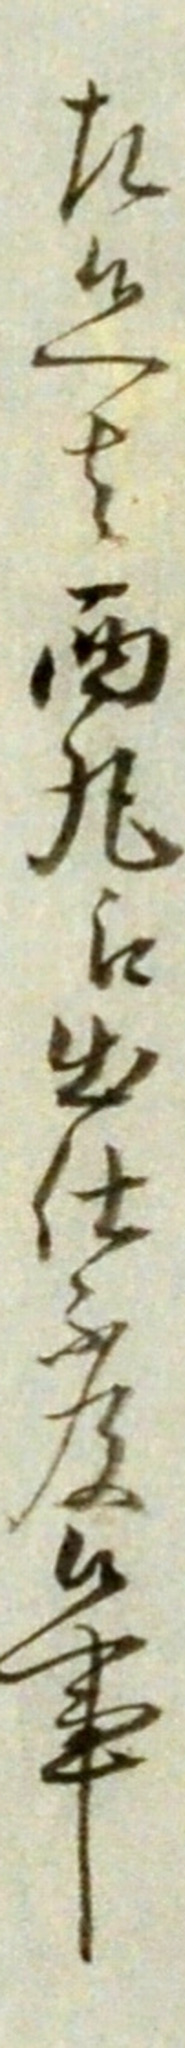左候へは西丸え出仕不及候事
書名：申合帳〔一括〕
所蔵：伊那市立高遠町図書館・合同会社AMANE
